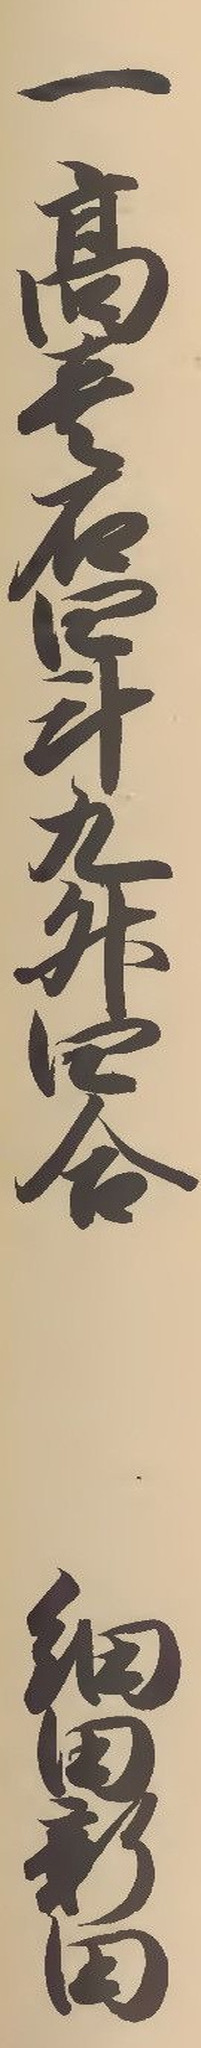一高壱石四斗九升四合細田新田
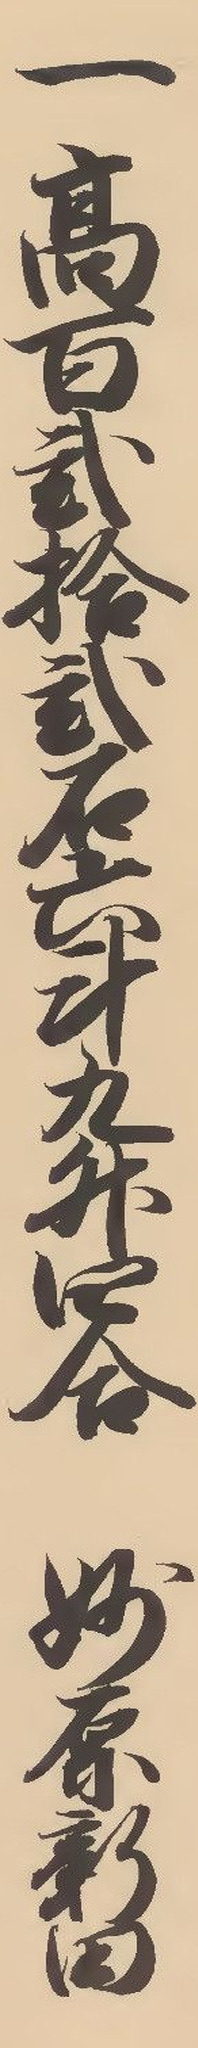一高百弐拾弐石六斗九升四合妙原新田
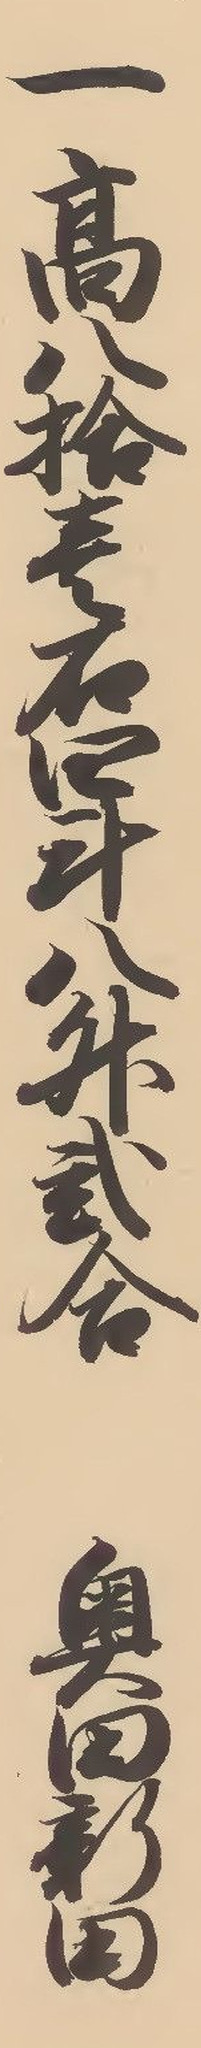一高八拾壱石四斗八升弐合奥田新田

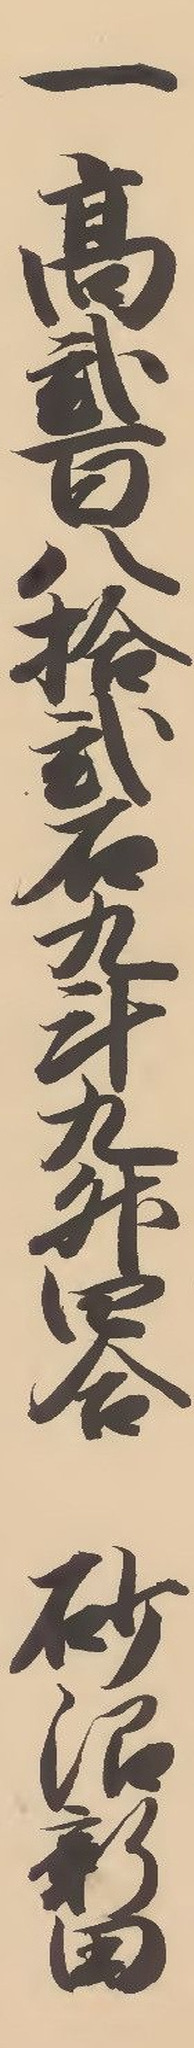一高弐百八拾弐石九斗九升四合砂沼新田
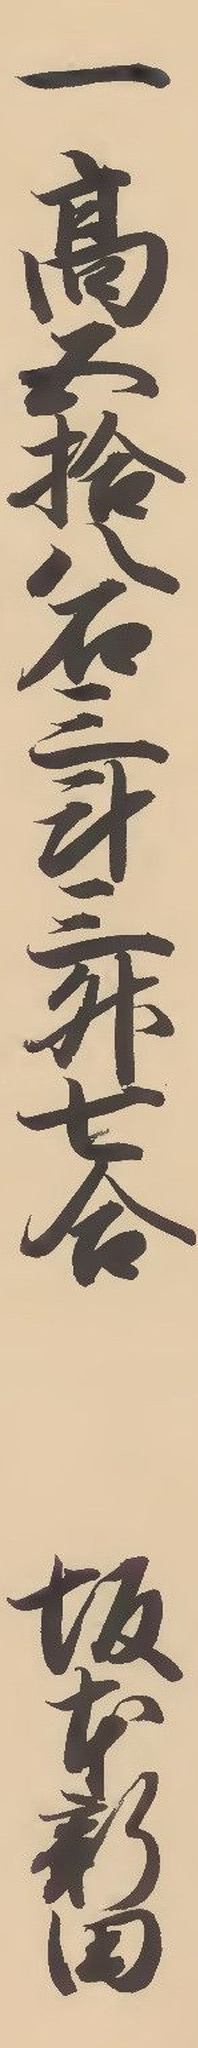一高五拾八石三斗三升七合坂本新田
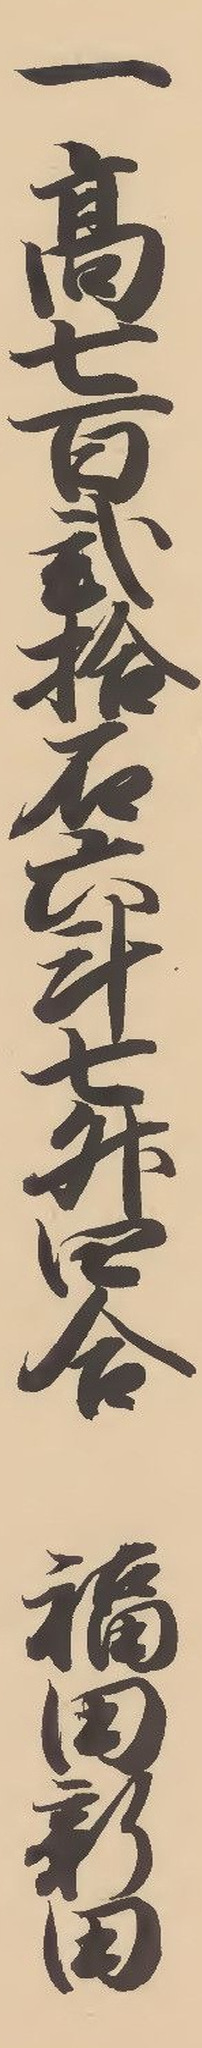一高七百弐拾石六斗七升四合福田新田
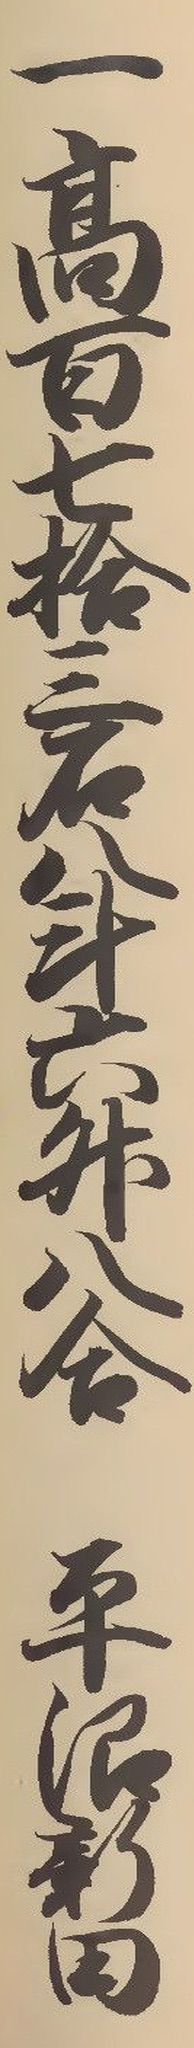一高百七拾三石八斗六升八合平沼新田
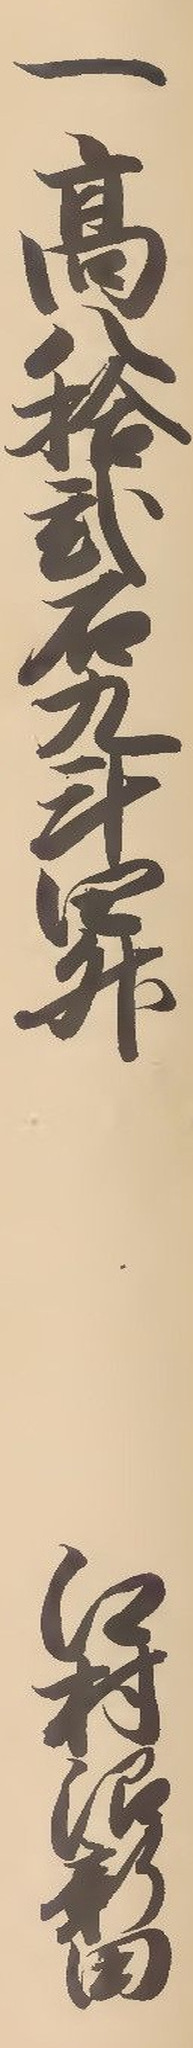一高八拾弐石九斗四升江村沼新田
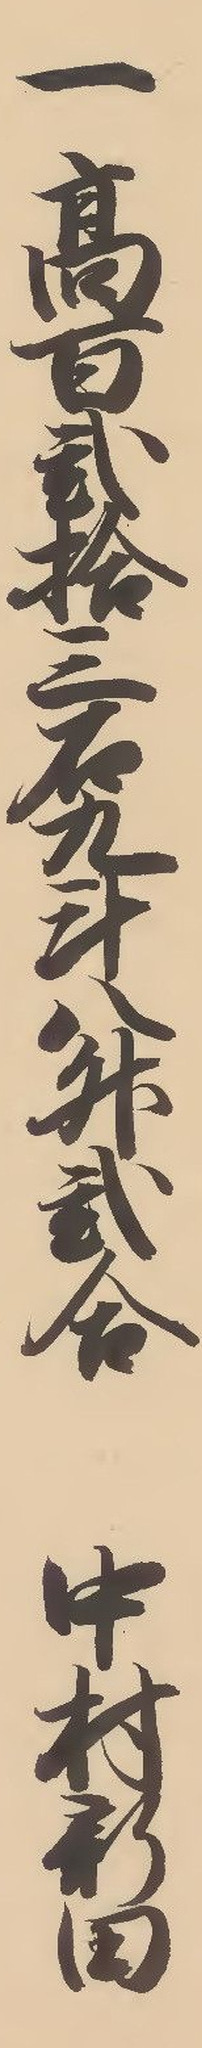一高百弐拾三石九斗八升弐合中村新田
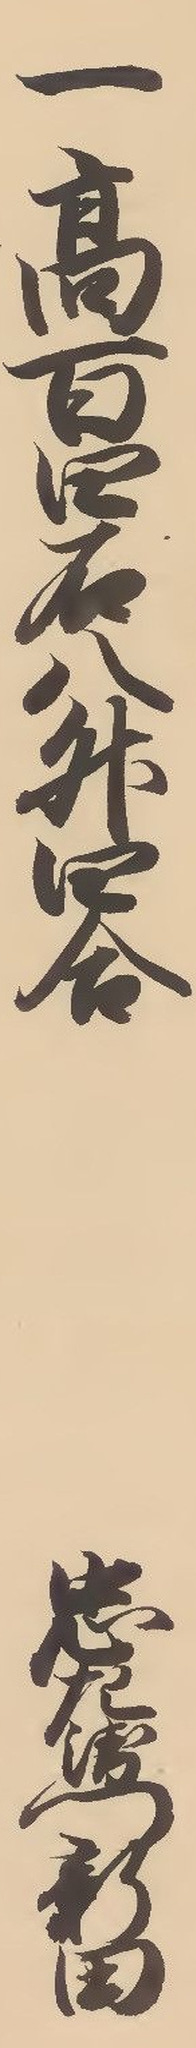一高百四石八升四合忠左衛門新田
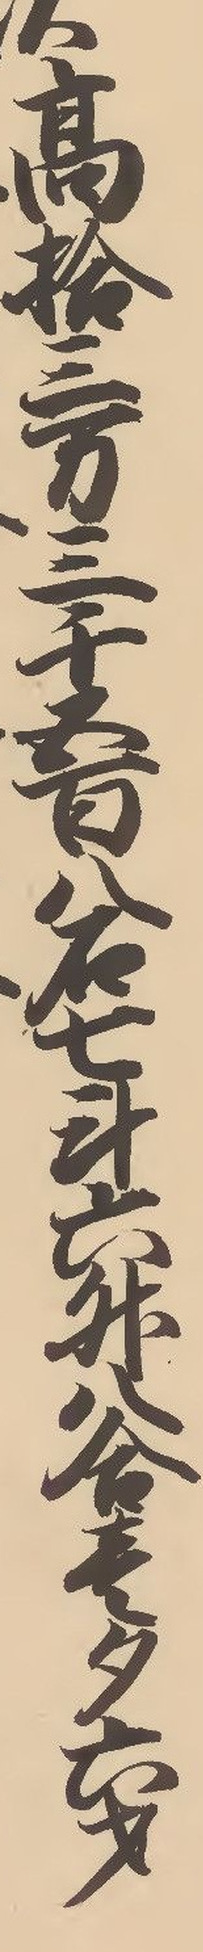小以高拾三万三千五百八石七斗六升八合壱勺六才
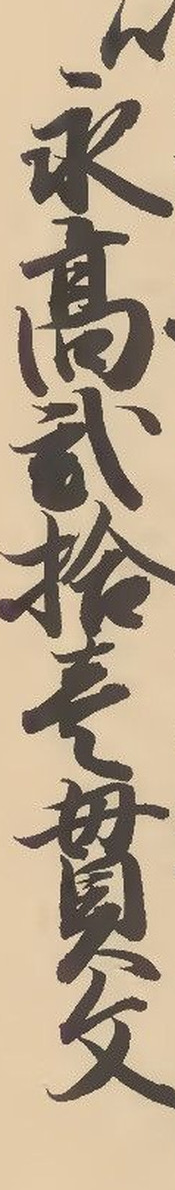永高弐拾壱貫文

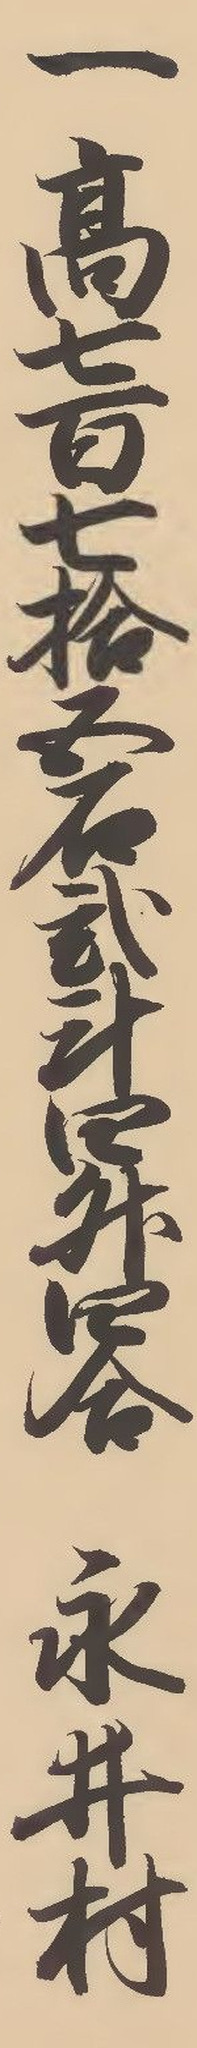一高七百七拾五石弐斗四升四合永井村
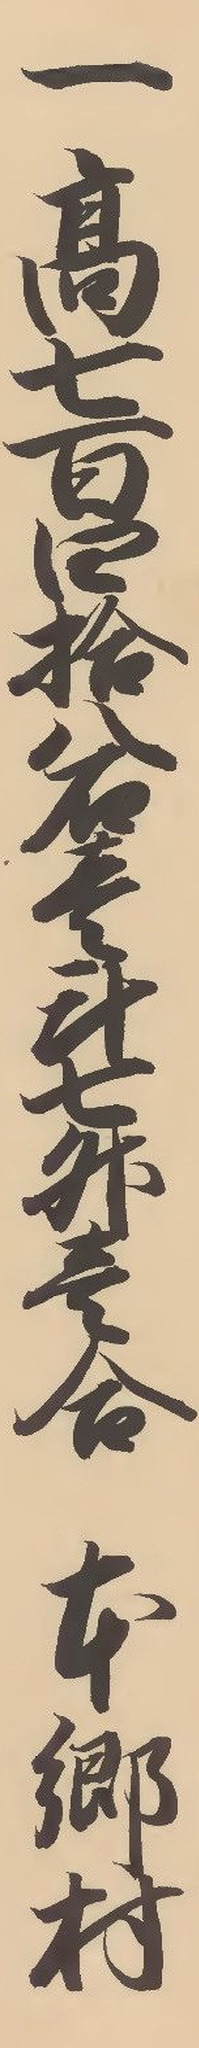一高七百四拾八石壱斗七升壱合本郷村
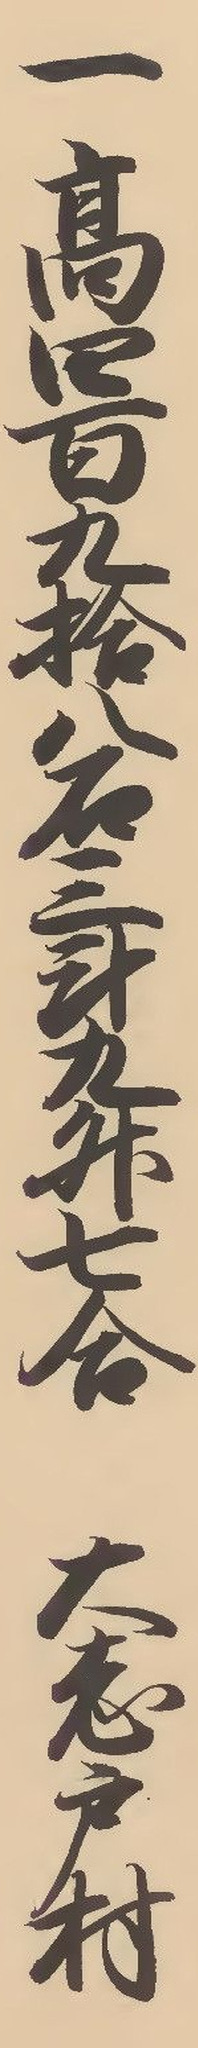一高四百九拾八石三斗九升七合大志戸村

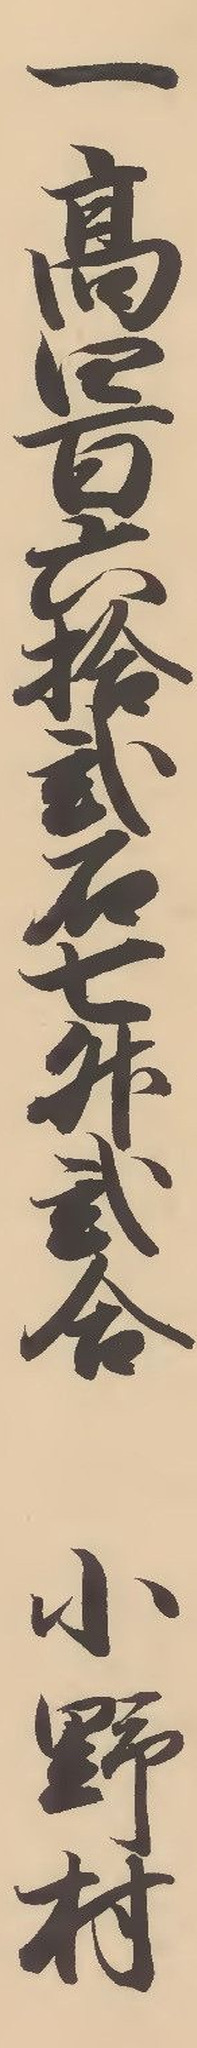一高四百六拾弐石七升弐合小野村
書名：常陸国郷帳
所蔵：国立公文書館 National Archives of Japan
